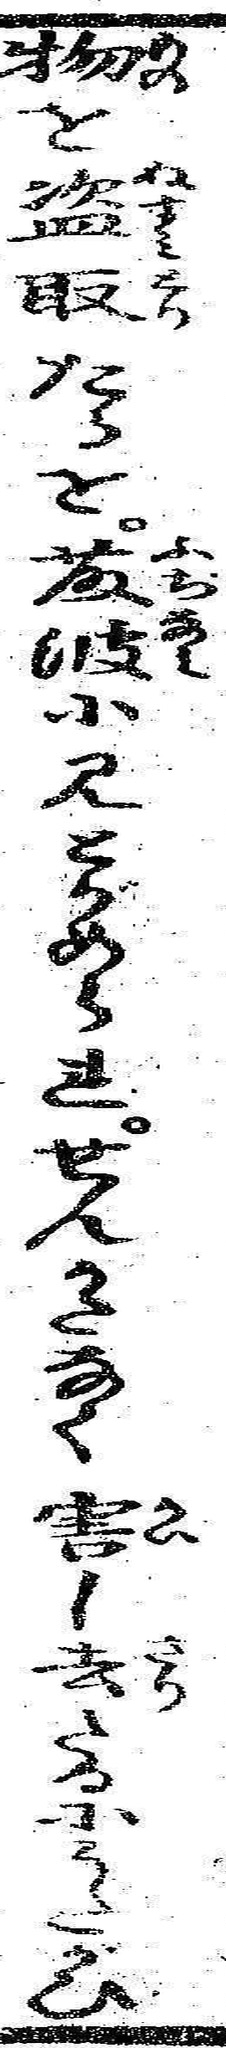物を盗取たるを。藤波に見とがめられ。せんかたなく害し去たるにうたがひ
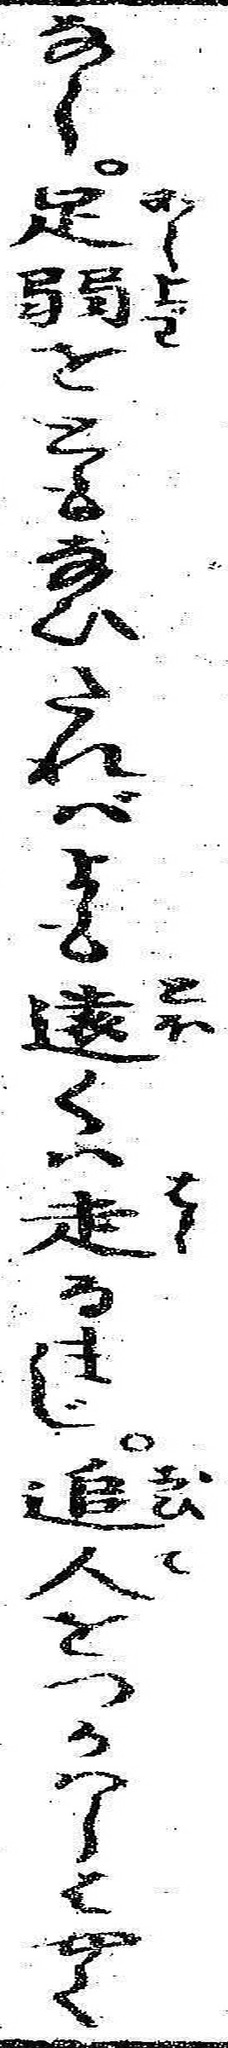なし。足弱をともなひたればよも遠くは走るまじ。追人をつかはしはやく
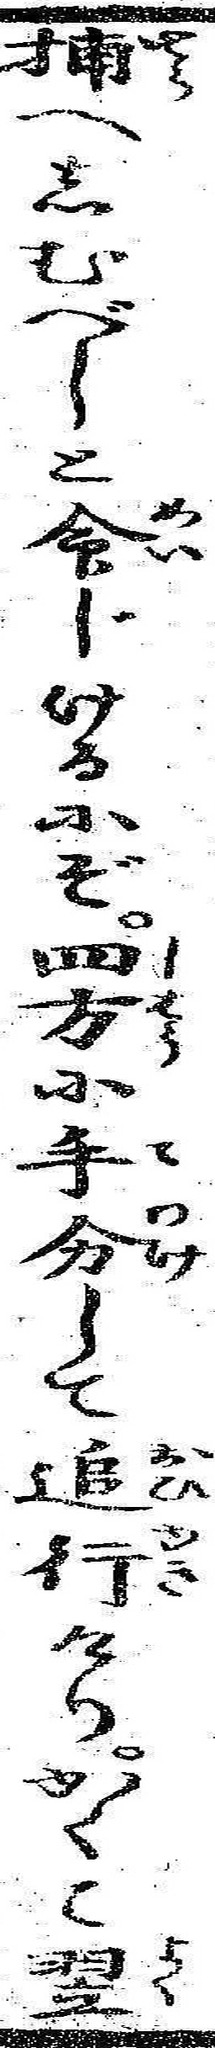捕へしむべしと命じけるにぞ。四方に手分して追行けり。かくて翌
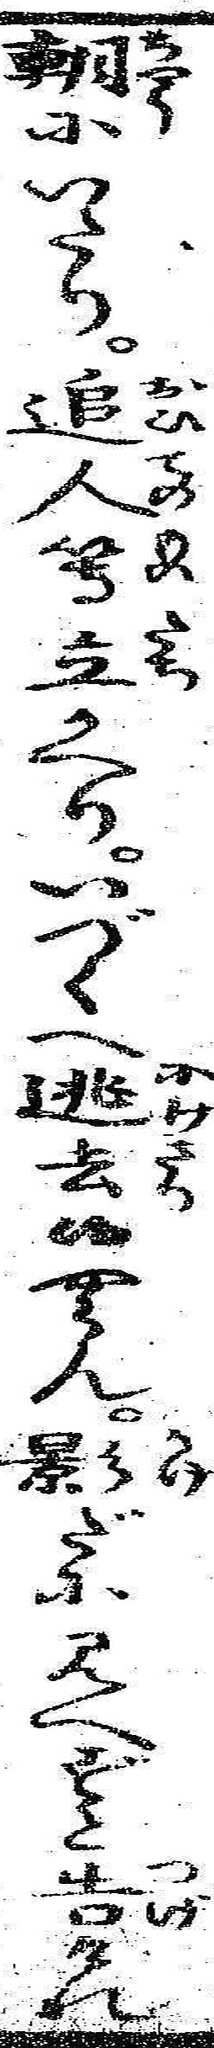朝にいたり。追人等立かへり。いづくへ逃去候やらん。影だに見へずと告けれ
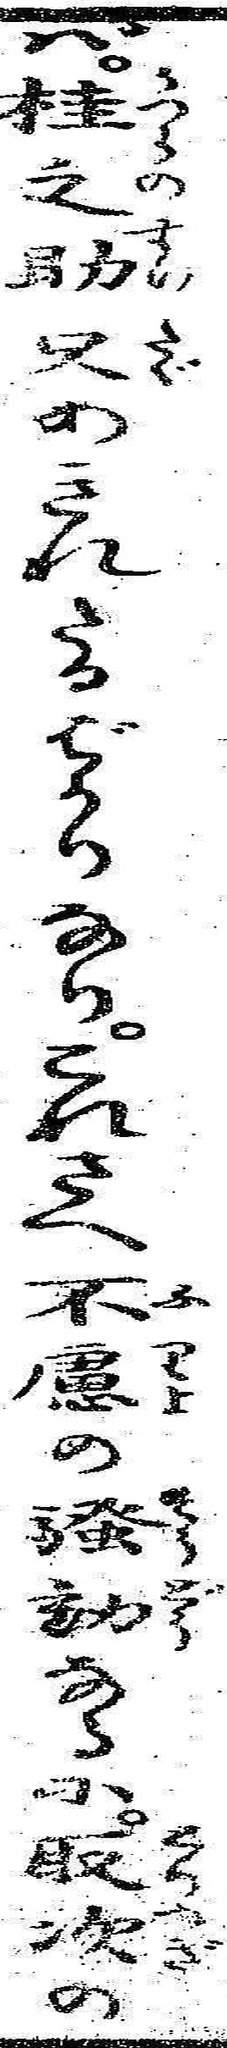ば。桂之助只あきれたるばかりなり。これさへ不盧の騒動なるに。取次の
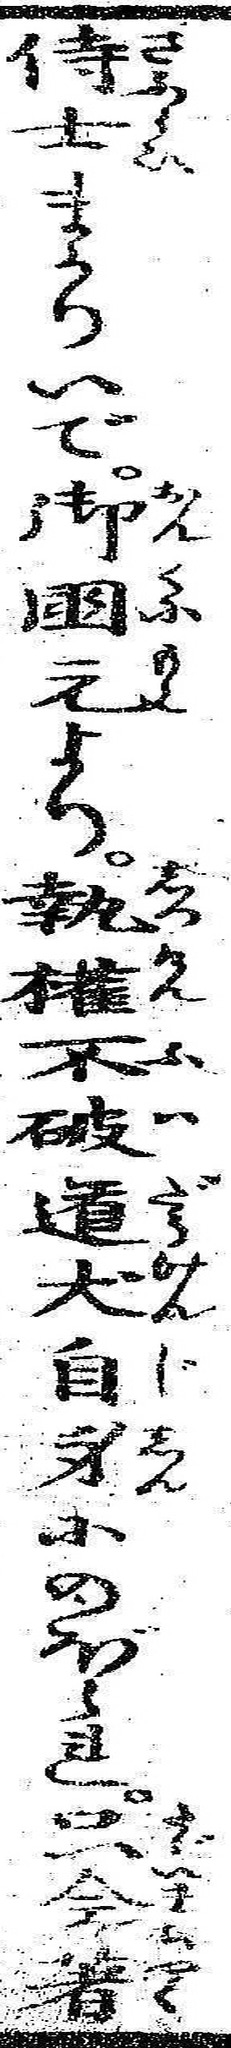侍士まかりいで。御国元より。執権不破道犬自身にのぼられ。只今著
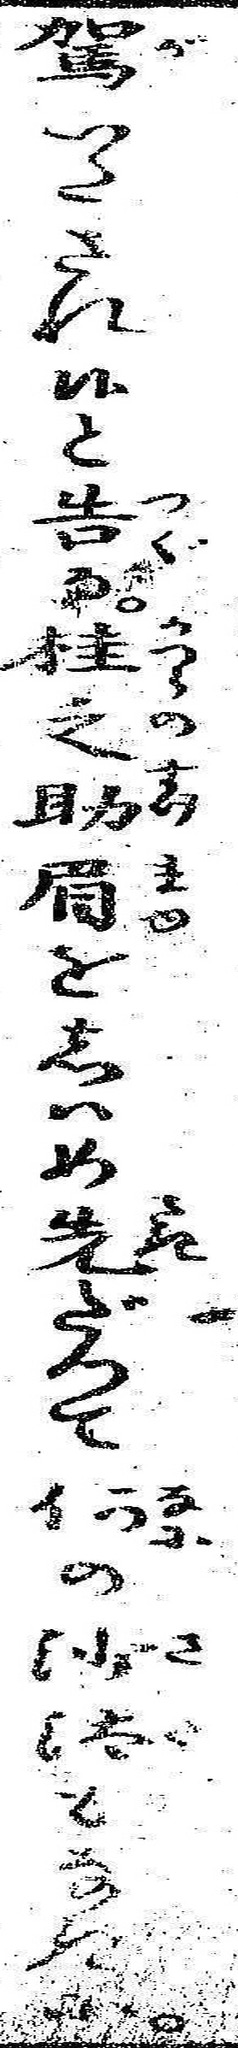駕いたされ候と告る。桂之助眉をしはめ先だつて何の沙汰もなきに。
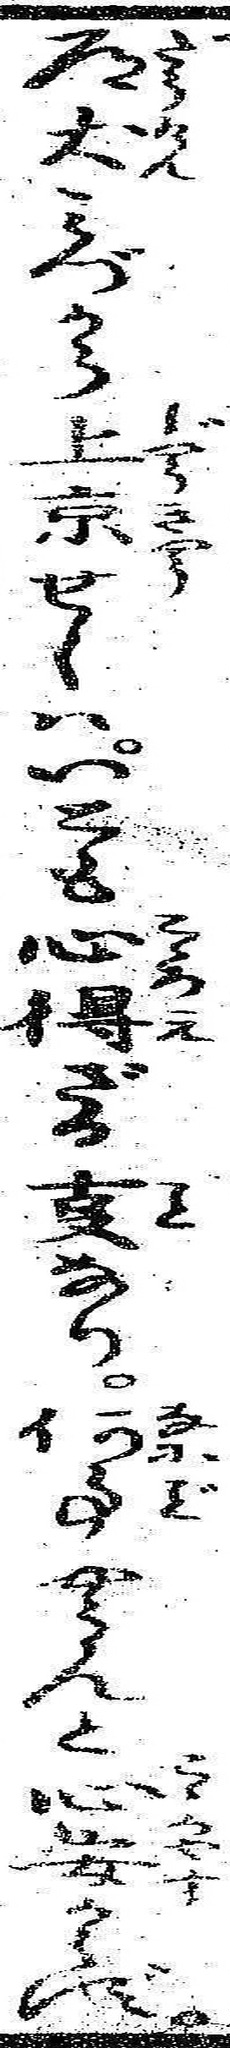道犬みづから上京せしは。いとも心得ざる事なり。何事やらんと心安からず。

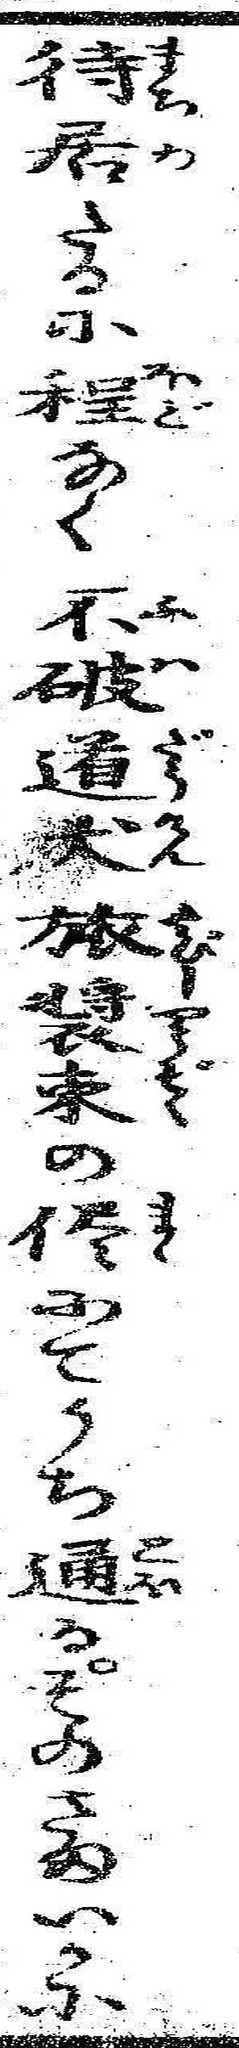待居たるに程なく不破道犬旅装束の侭にてうち通る。そのさまいかに
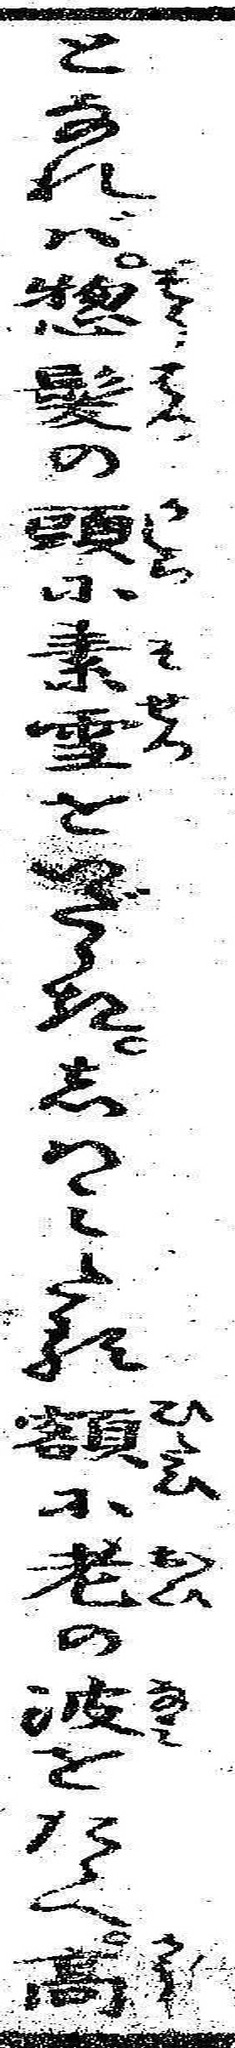となれば。惣髪の頭に素雪をいだゝき。しはみたる額に老の波をたゝへ。高
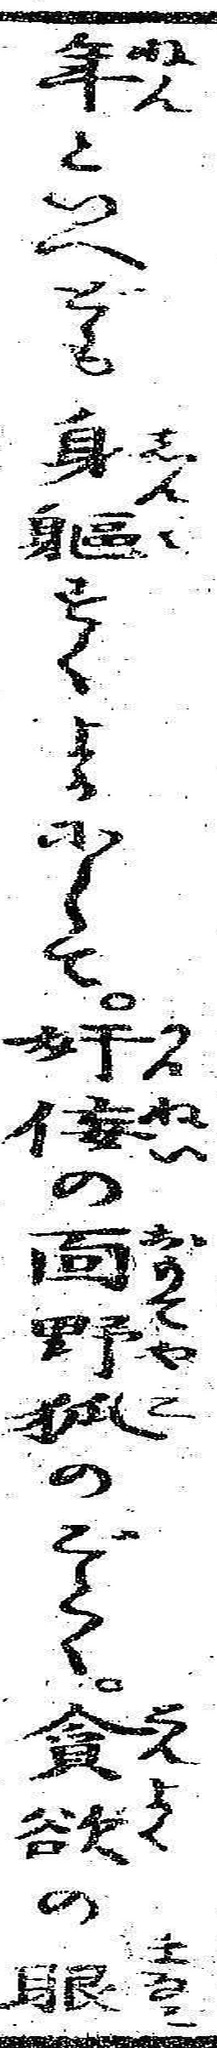年といへども身躯すくよかにして。奸佞の面野狐のごとく。貪欲の眼
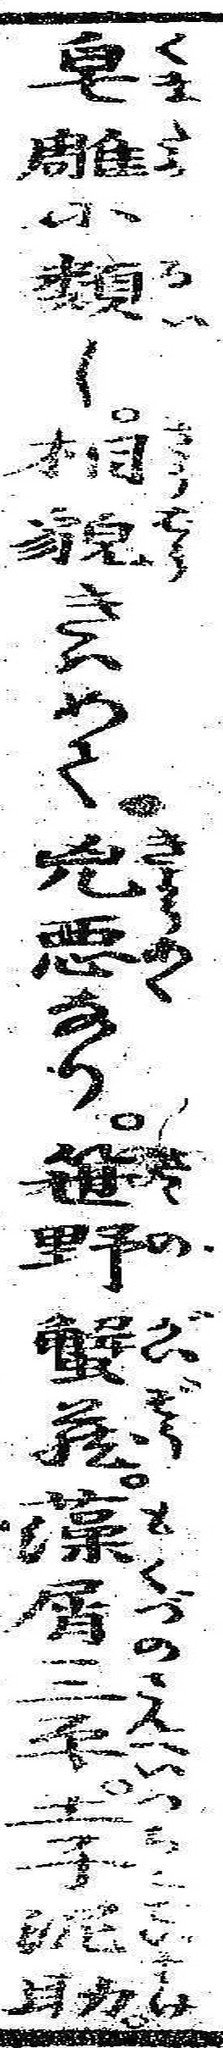皂雕に類し。相貌きはめて。兇悪なり。笹野蟹蔵。藻屑三平。土子泥助。
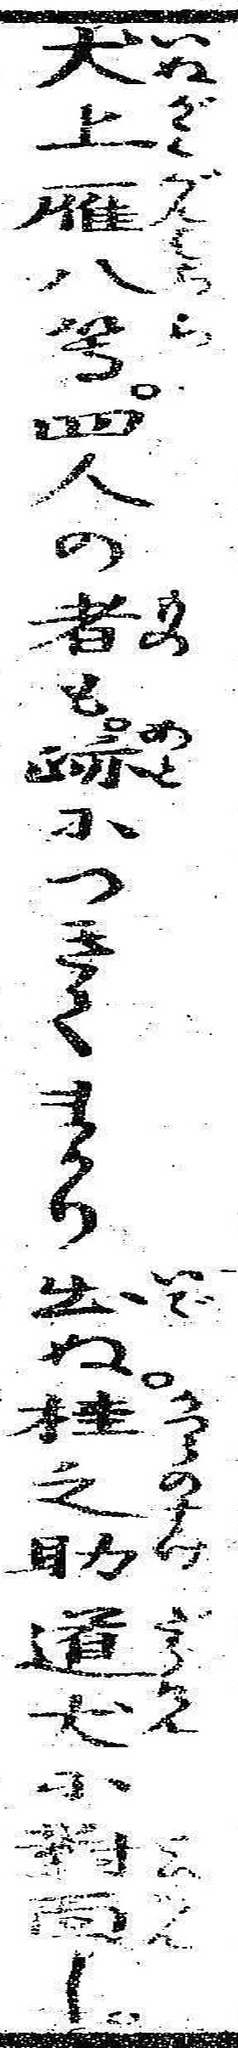大上雁八等。四人の者も。跡につきてまかり出ぬ。桂之助道犬に対面し。
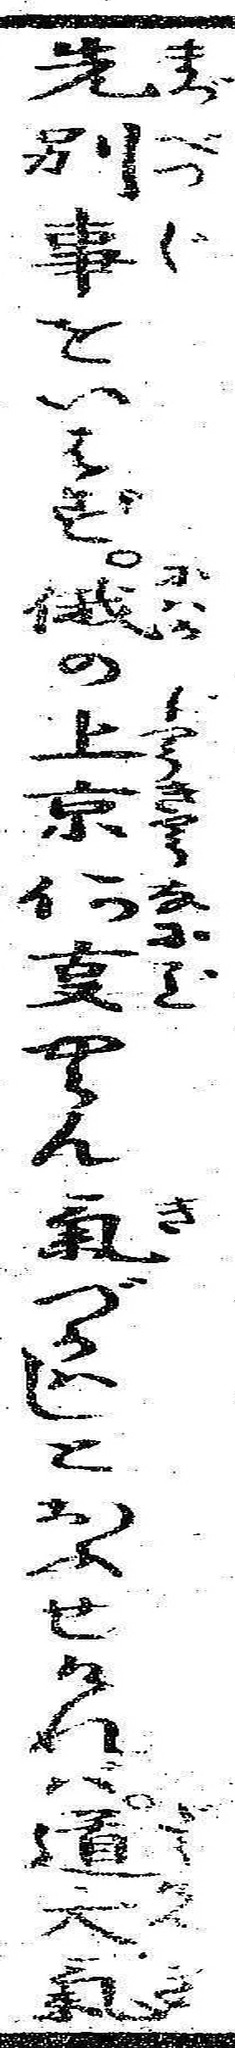先別事をいはず。俄の上京何事やらん気づかはしとおふせければ。道犬気
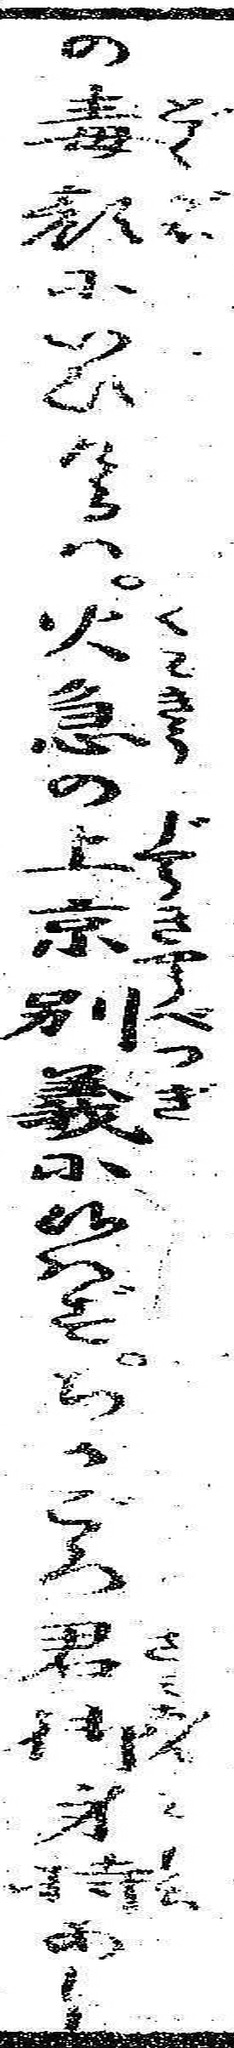の毒顔にいひけるは。火急の上京別義に候はず。ちかごろ君御身持あし
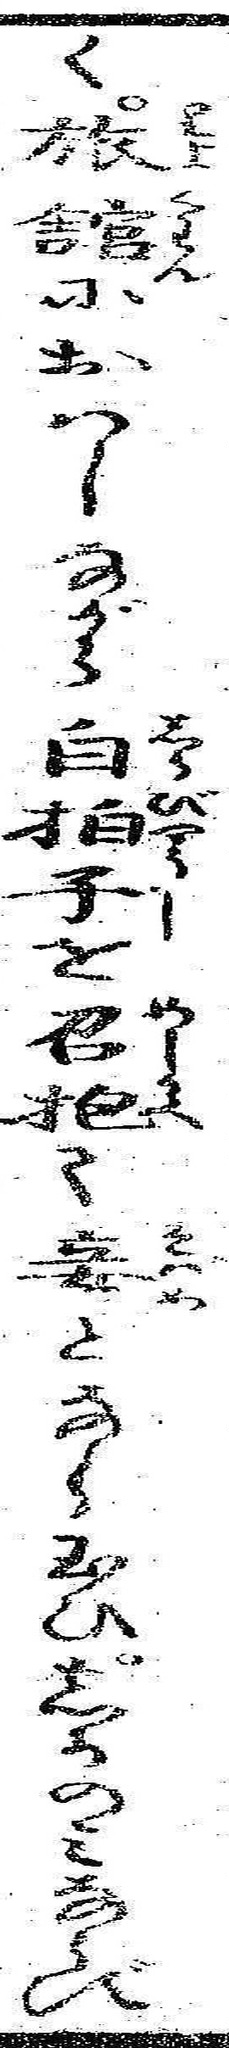く。旅館におはしながら白拍子を召抱て妾となし玉ひ。しかのみならず
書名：昔話稲妻表紙
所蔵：国文学研究資料館
